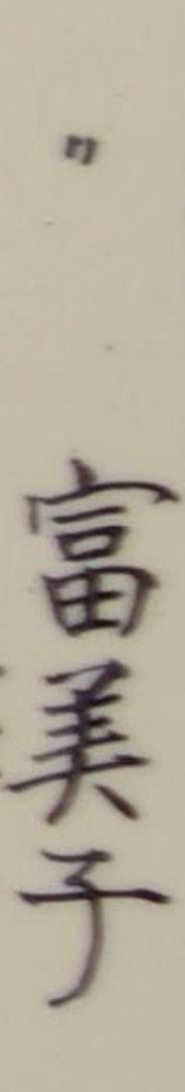富美子
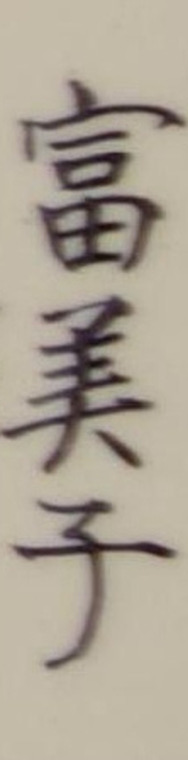富美子
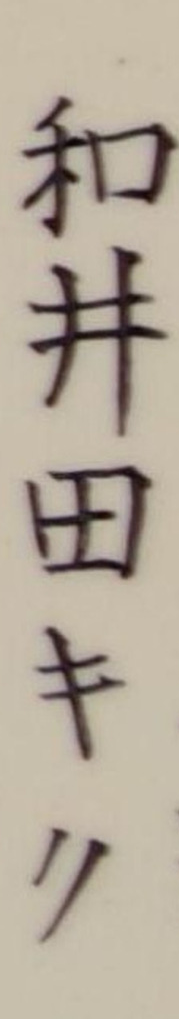和井田キク
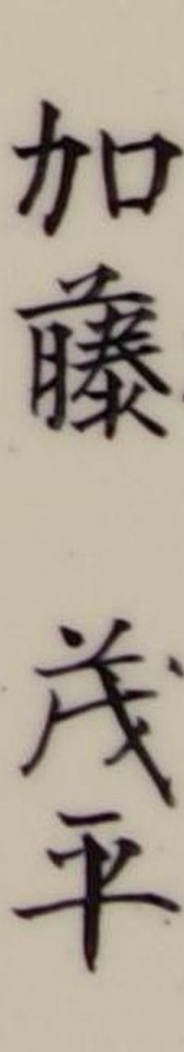加藤茂平
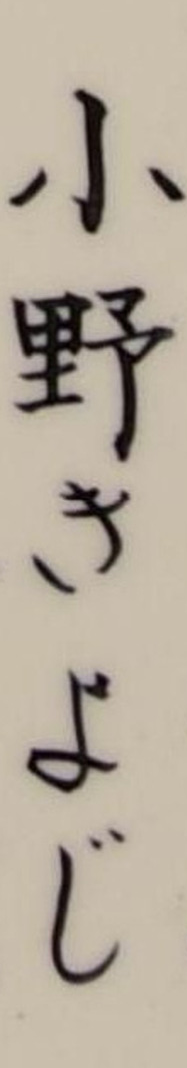小野きよじ
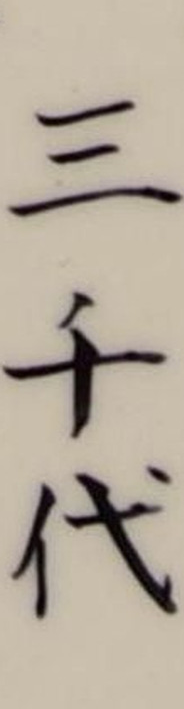三千代
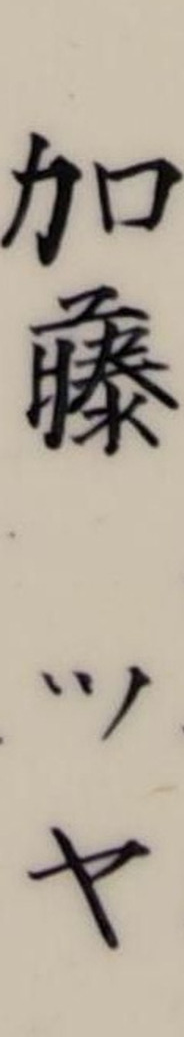加藤ツヤ
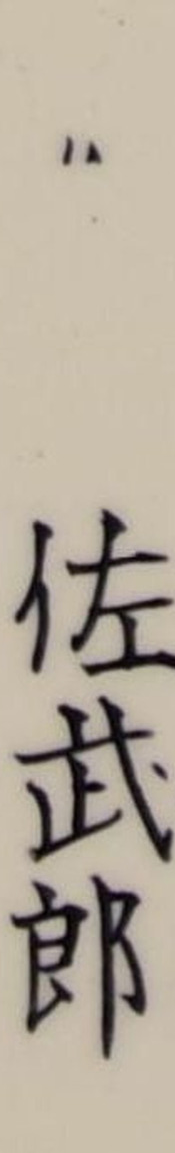佐武郎
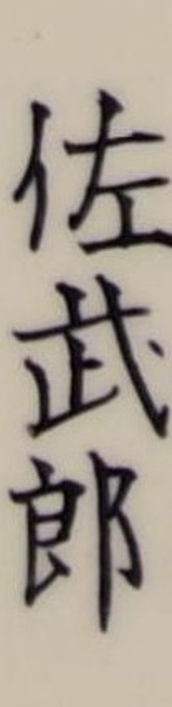佐武郎
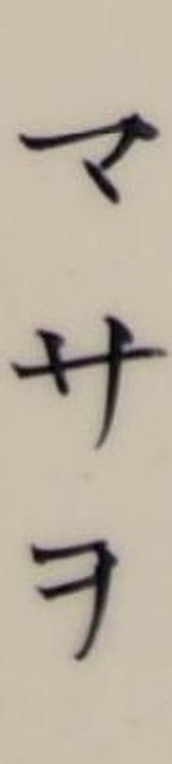マサヲ
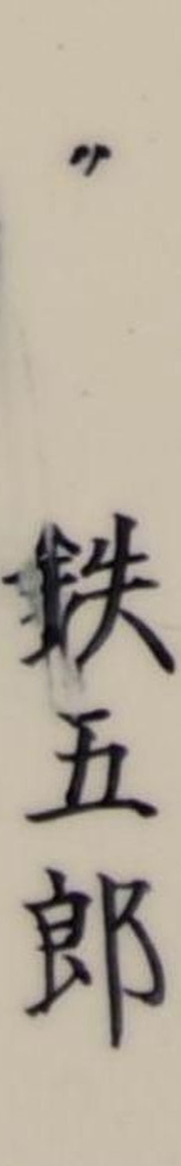鉄五郎
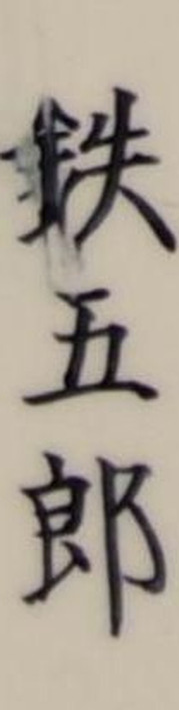鉄五郎
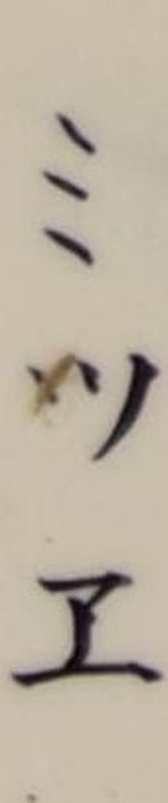ミツエ
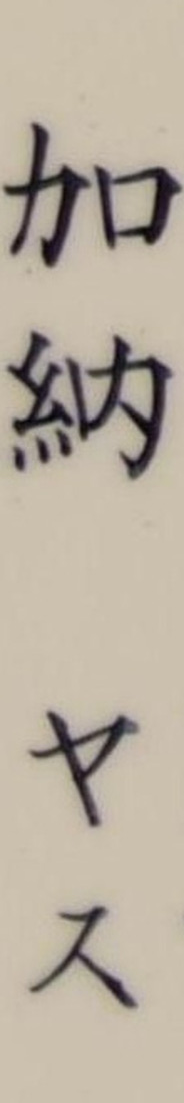加納ヤス
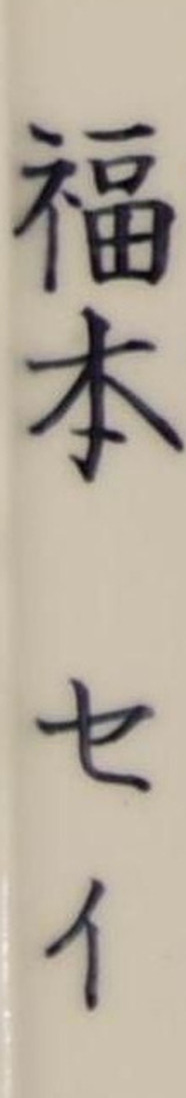福本セイ

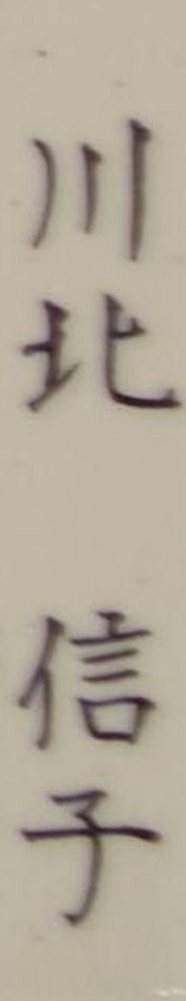川北信子
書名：E~L
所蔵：高野山金剛峯寺
